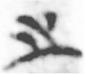之
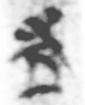○（右）
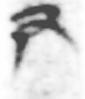尹
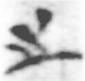之
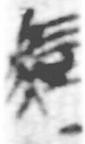騏
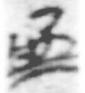○（左）
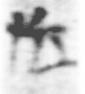○（服）
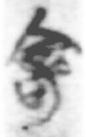宰
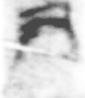尹
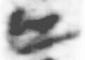臣
